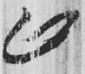㠯（以）
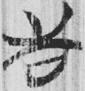告
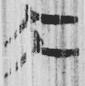大（太）
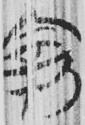○（宰）
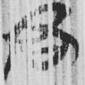君
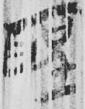聖
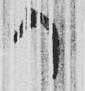人
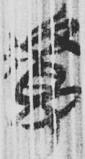○（且）
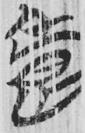良
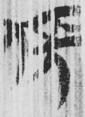倀（長）
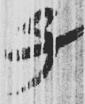子
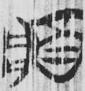𨟻（將）
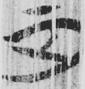正
